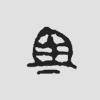寒
